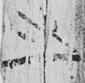之
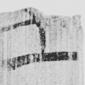皇
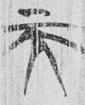天
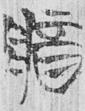𨟻（將）
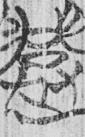○（與）
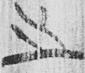之
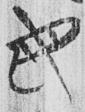母
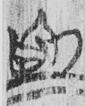爲
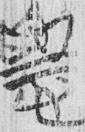○（僞）
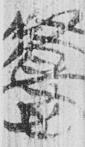○（詐）
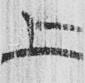上
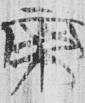帝
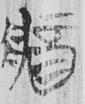𨟻（將）
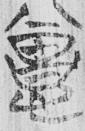憎
